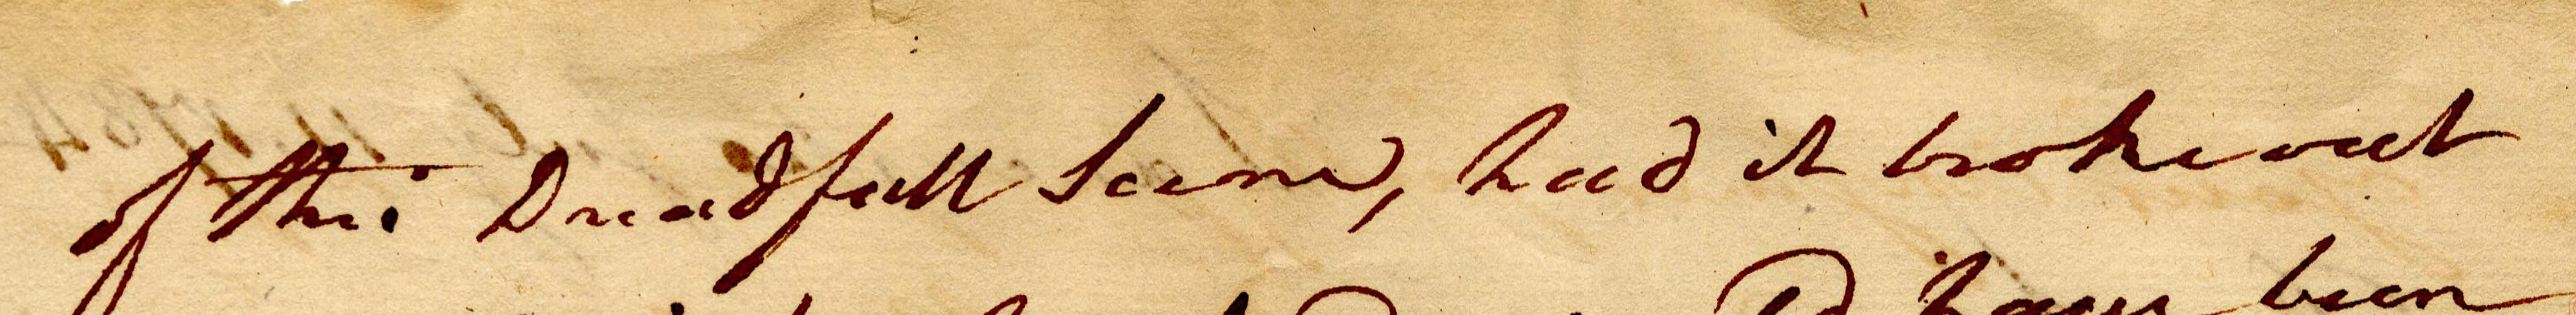of this Dreadfull scene, had it broke out
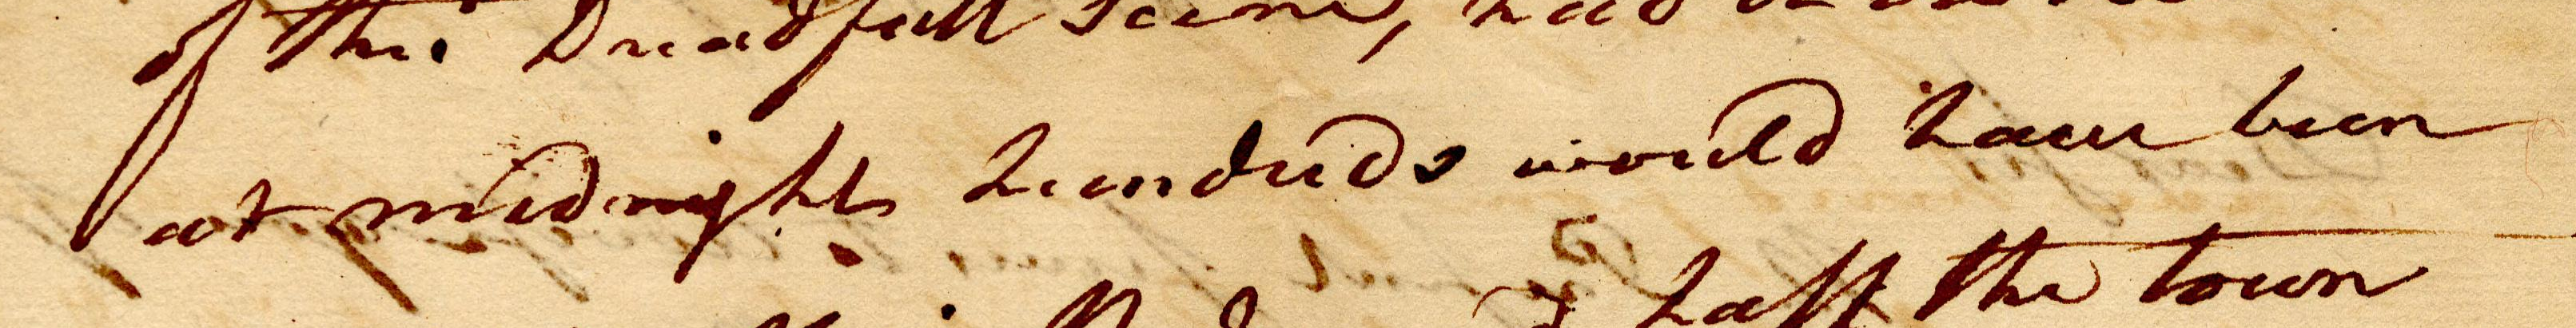at midnight hundreds would have been
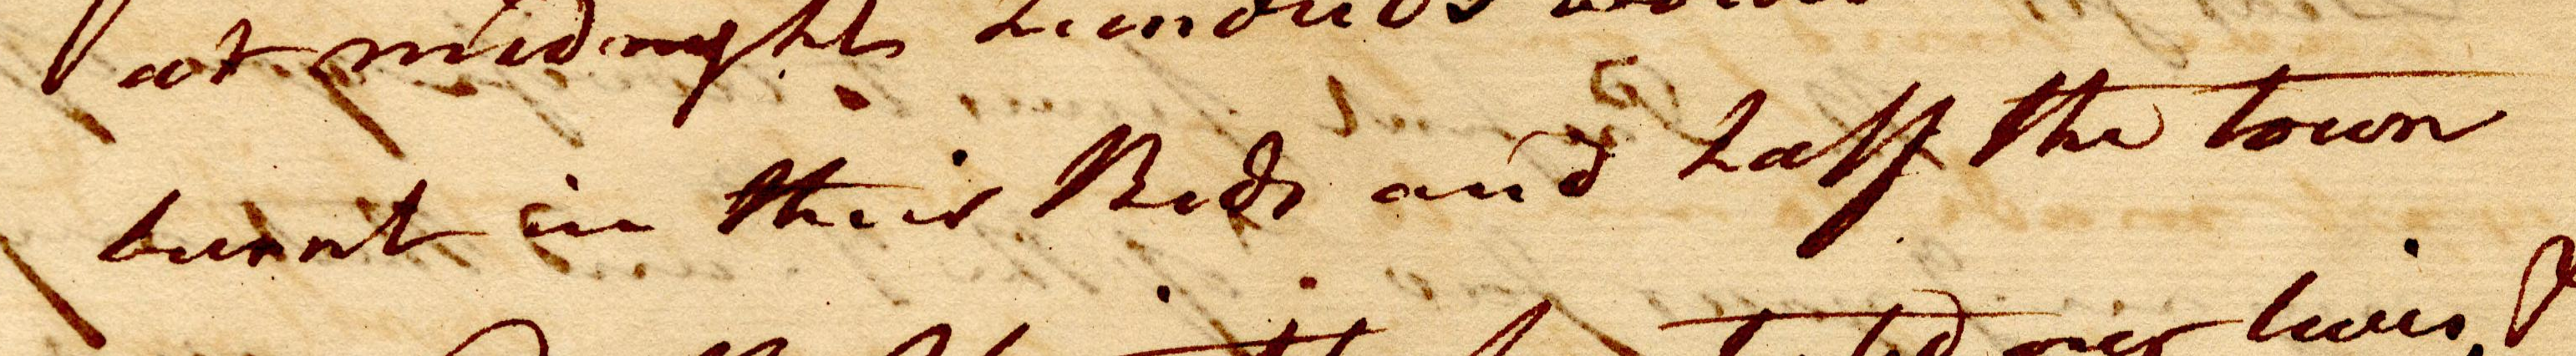burnt in their Beds and half the town
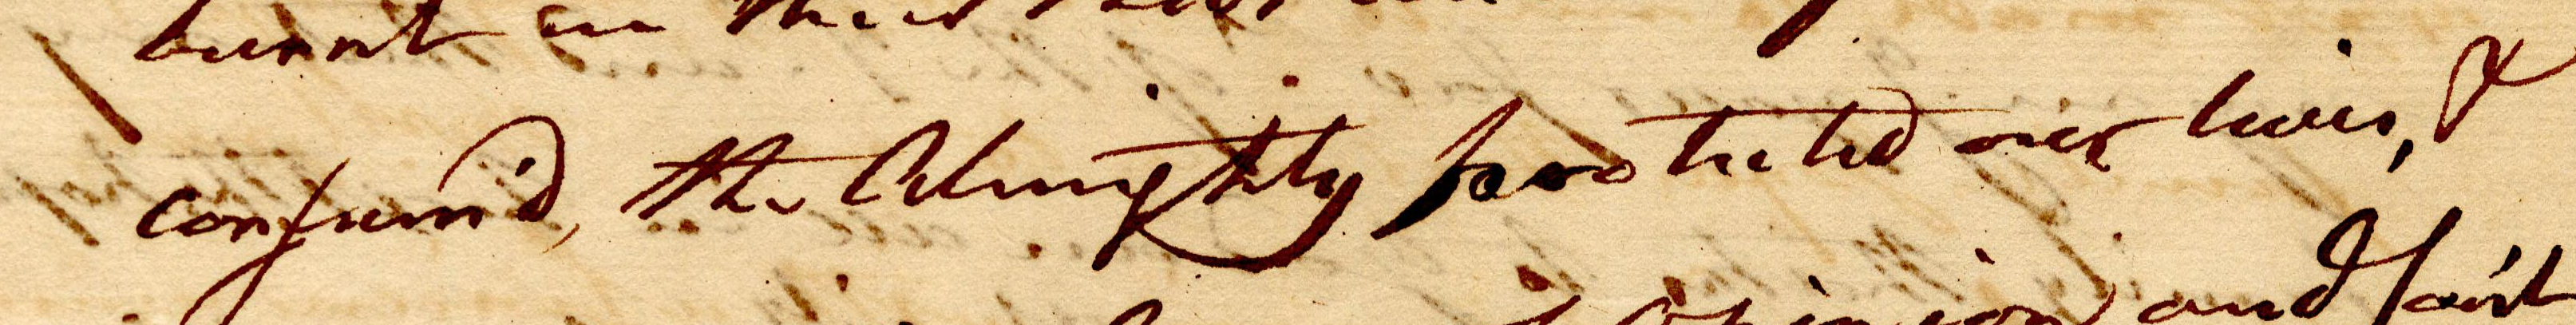consum'd, the Almighty protected our lives, &
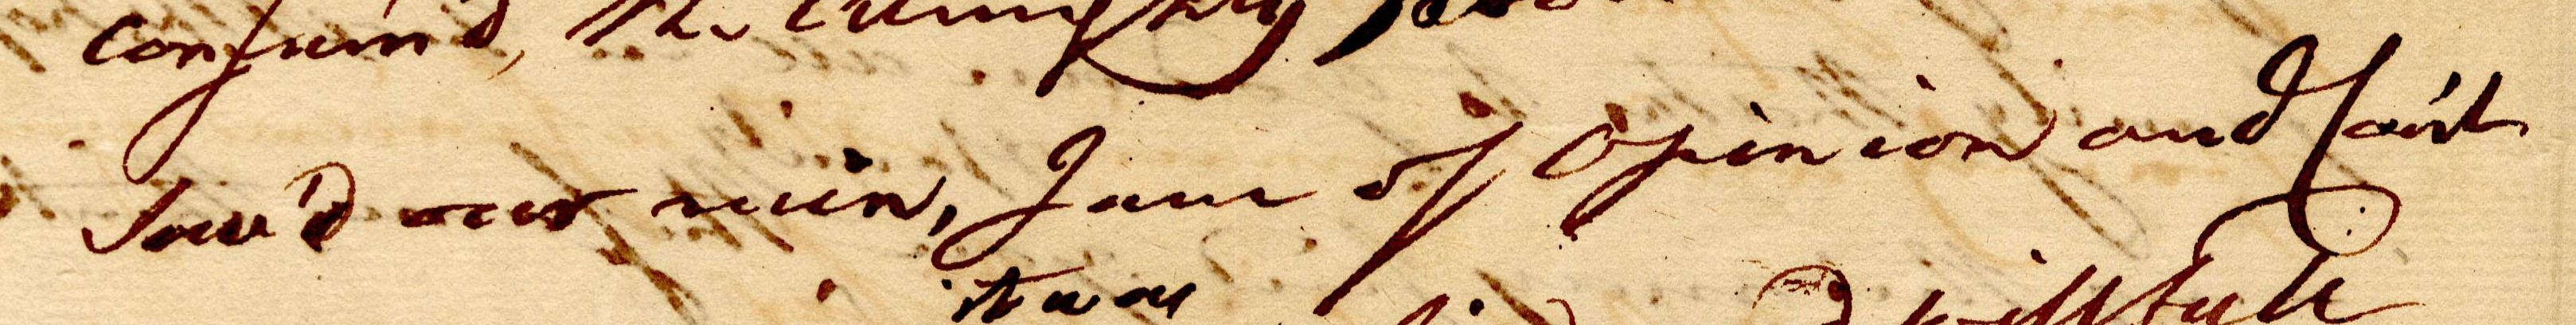sav'd our ruin, I am of opinion and Can't
